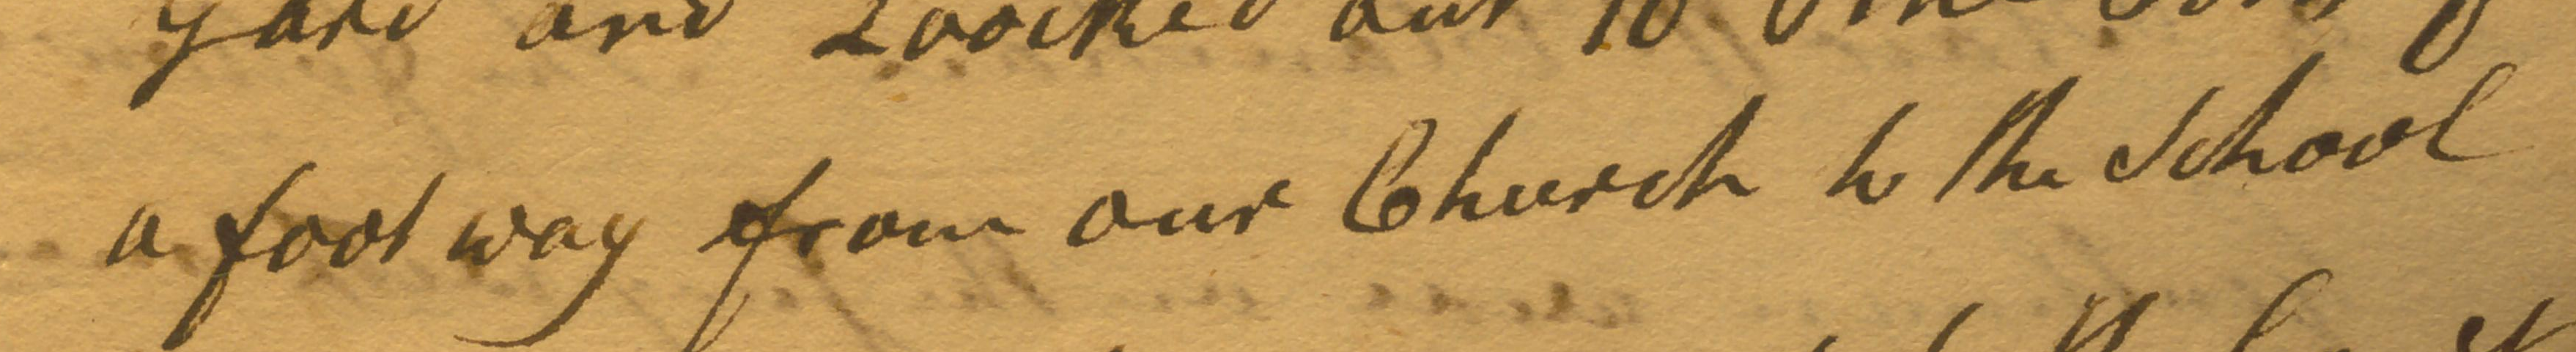a foot way from our Church to the School
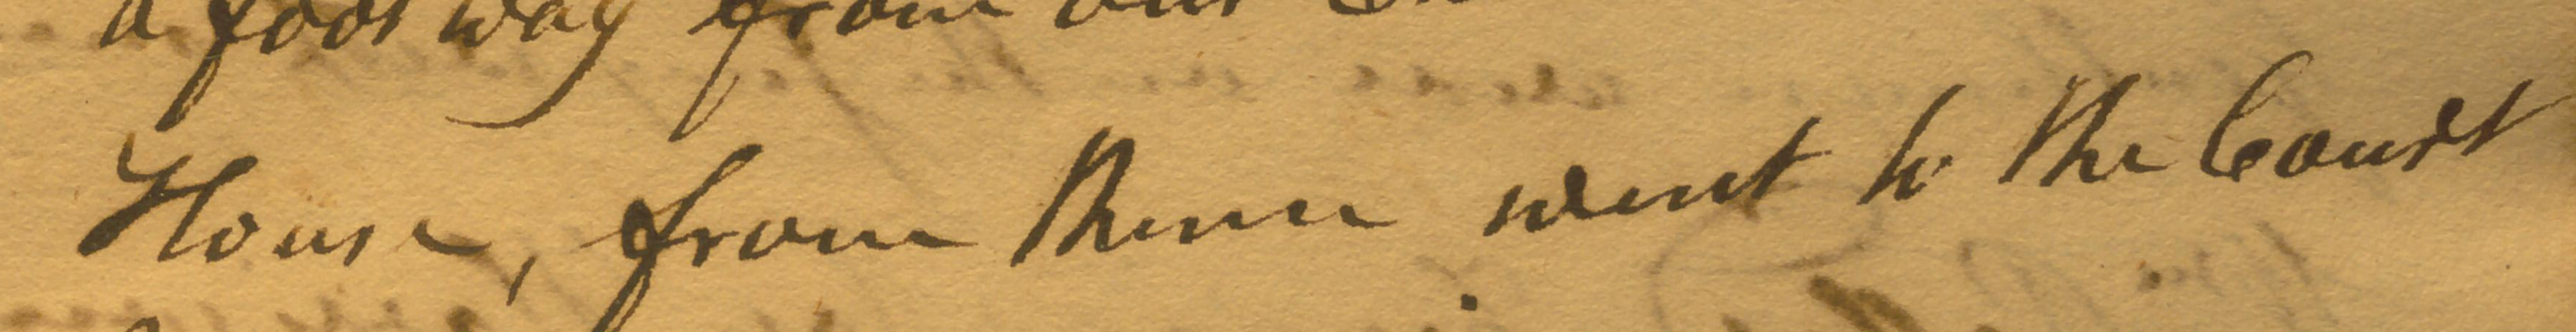House, from thence went to the Court
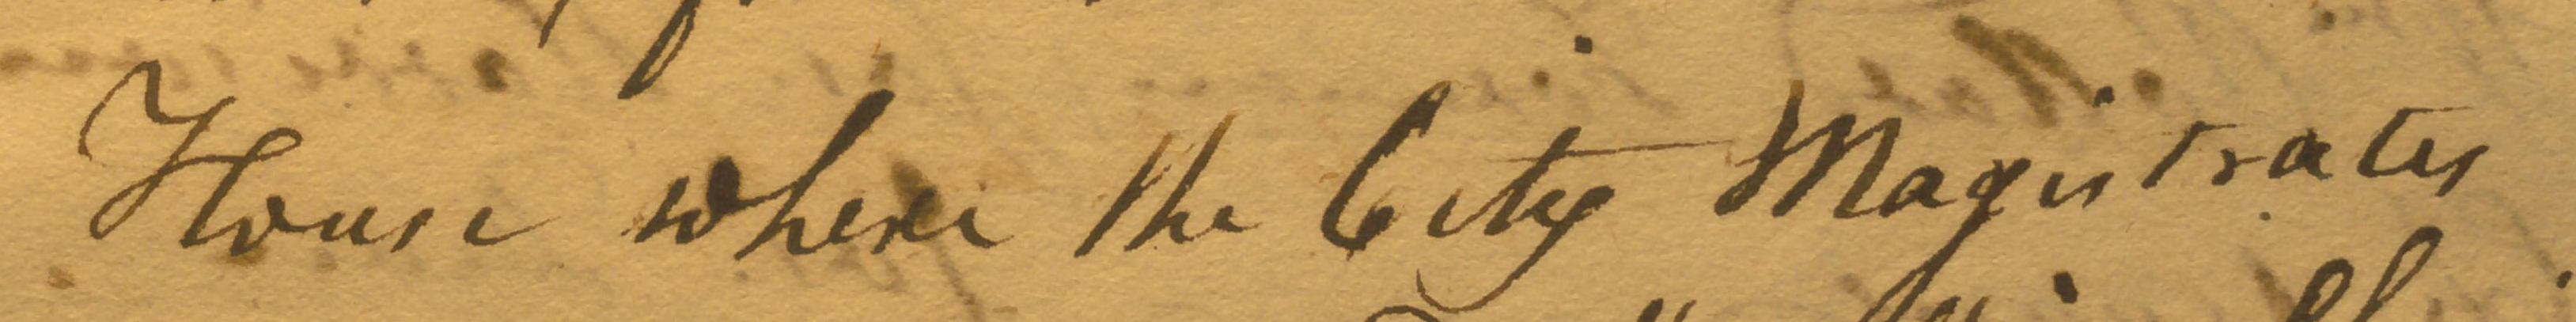House where the City Magistrates
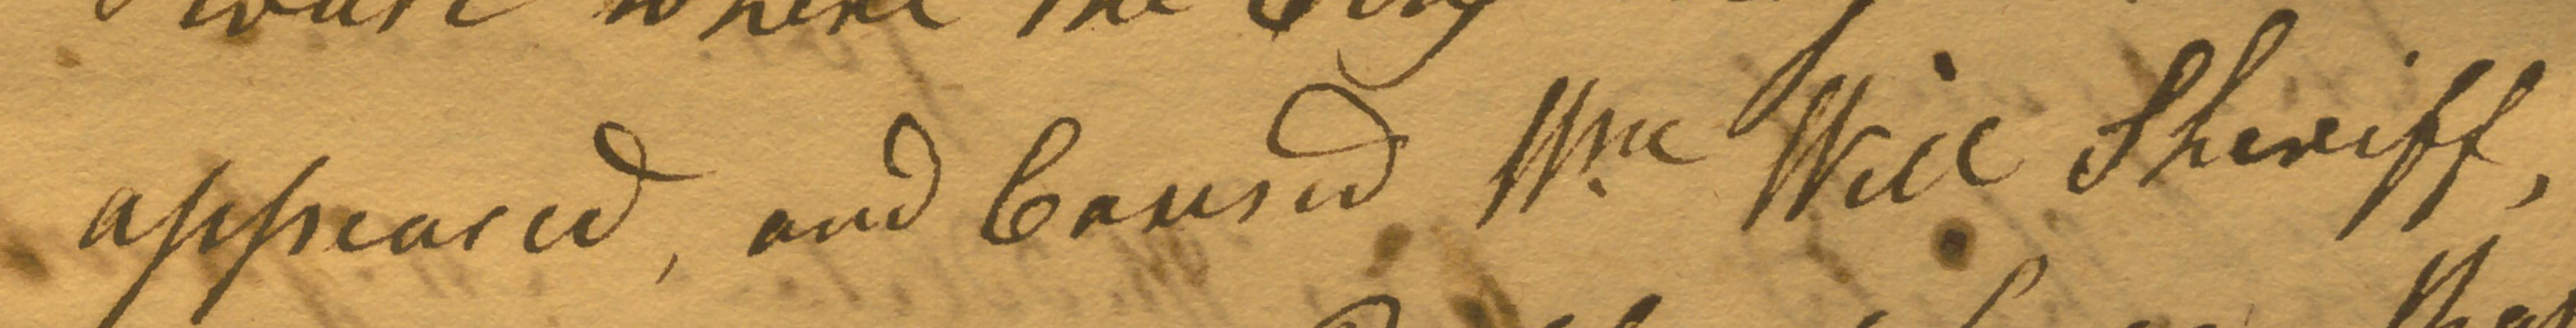appeared and Caused W^m. Will Sheriff
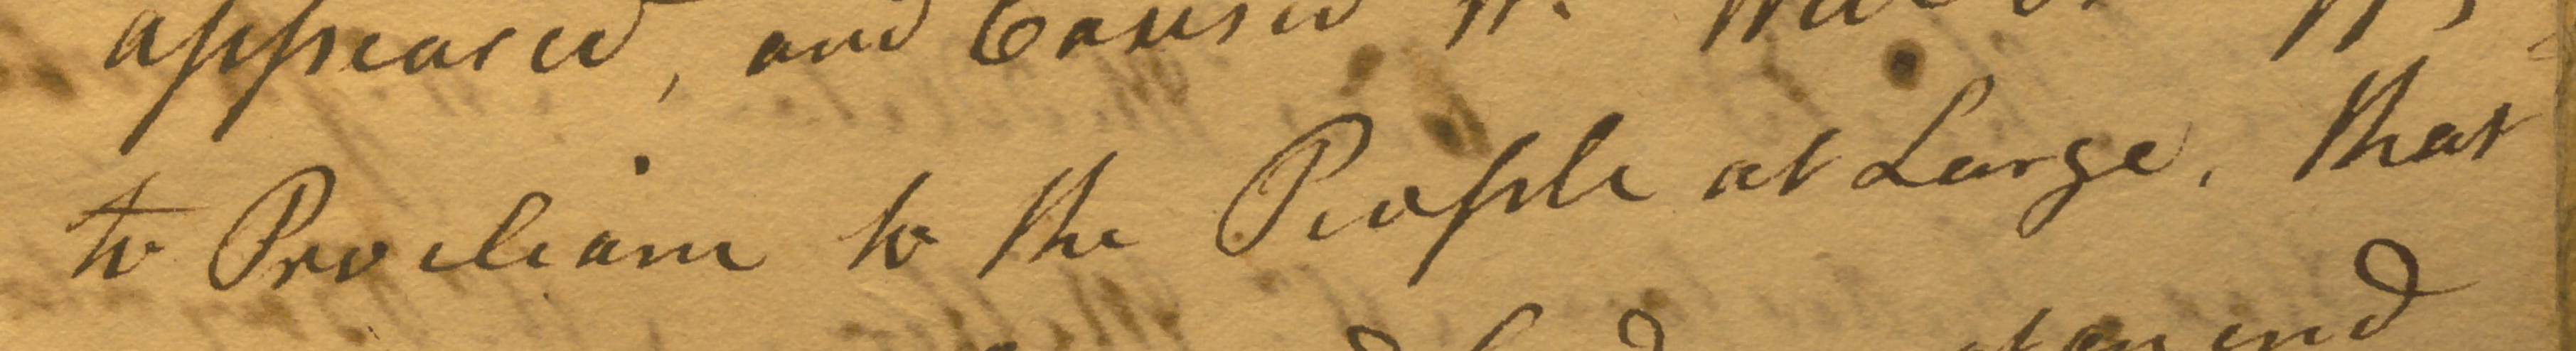to Proclaim to the People at Large. that
